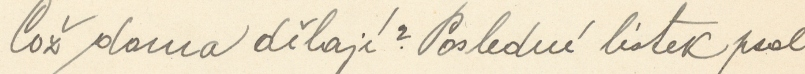Což doma dělají? Poslední lístek psal
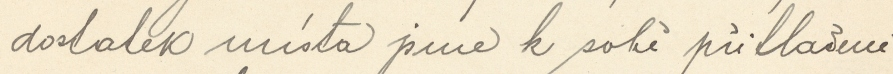dostatek místa jsme k sobě přitlačeni
